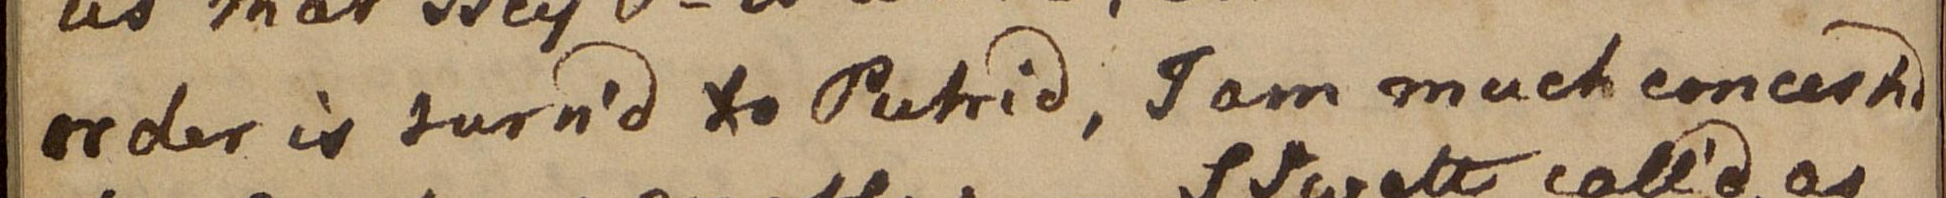order is turn'd to Putrid, I am much concern'd
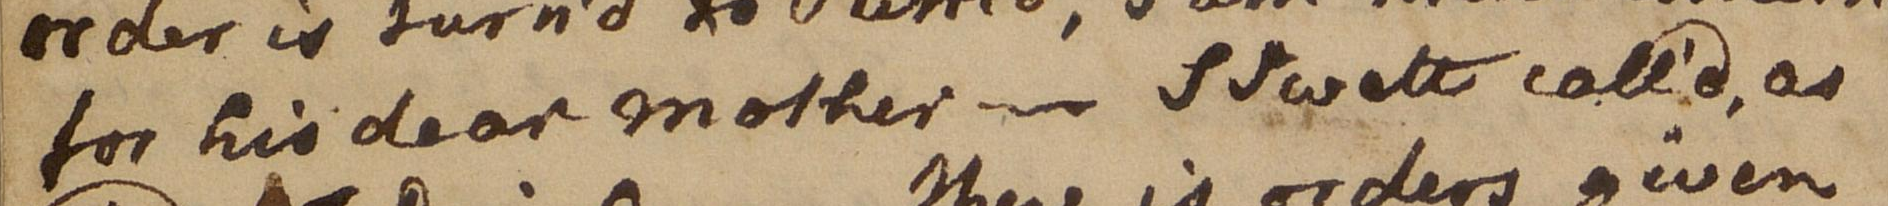for his dear mother- S Swett call'd, as
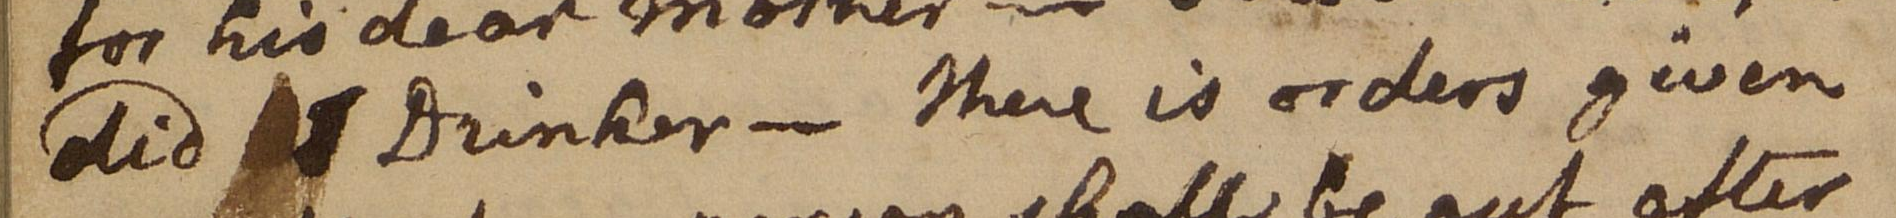did I Drinker- there is orders given
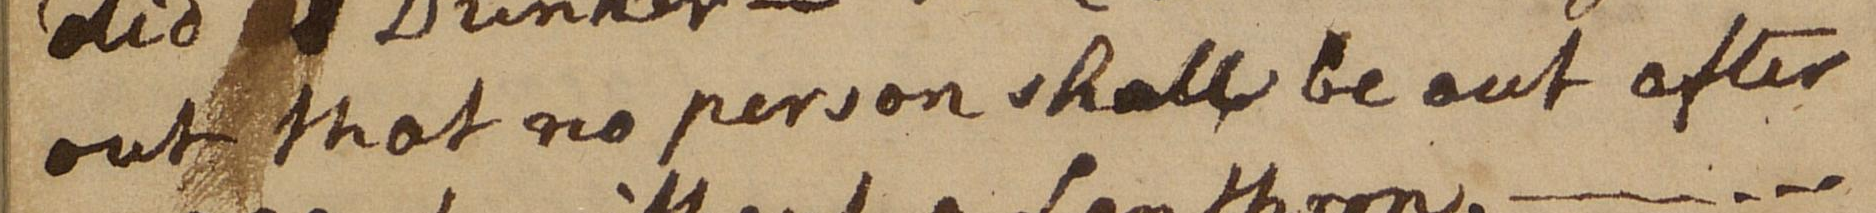out that no person shall be out after
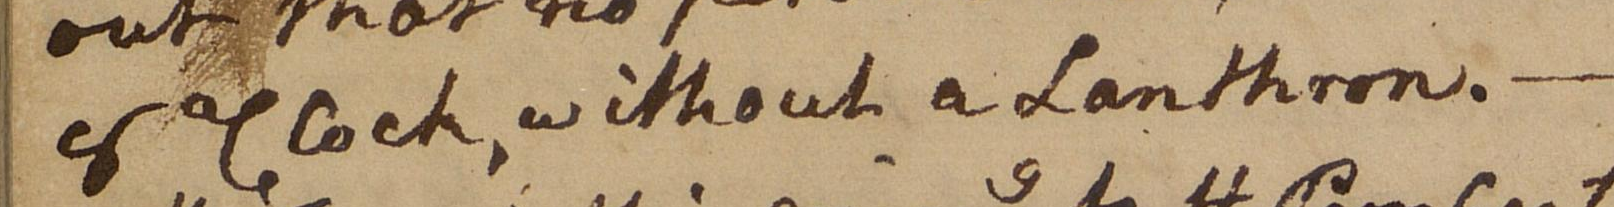8 ^oClock, without a Lanthron.-
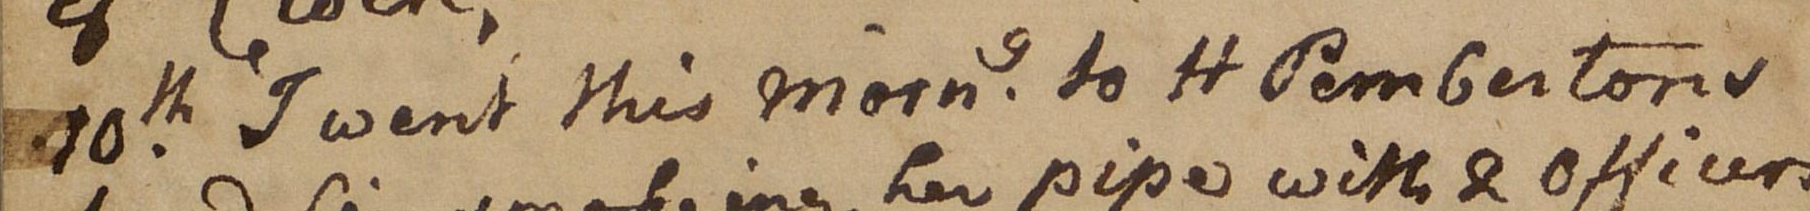10^th. I went this Morn^g. to H Pembertons
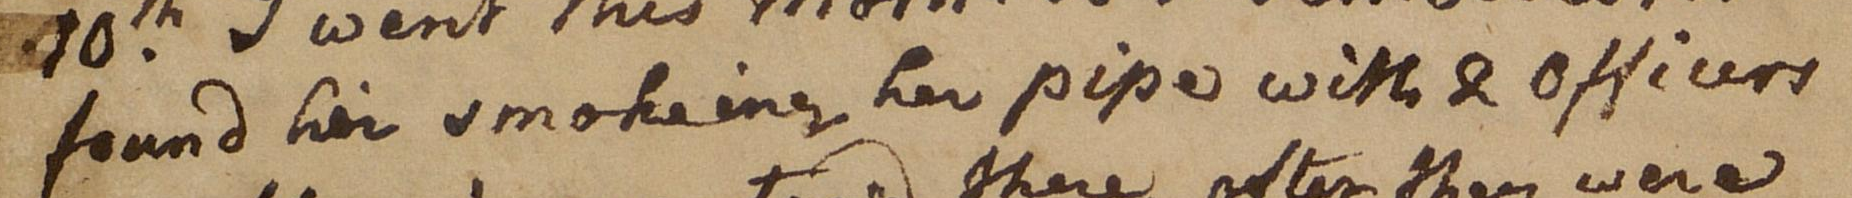found her smokeing her pipe with 2 Officers
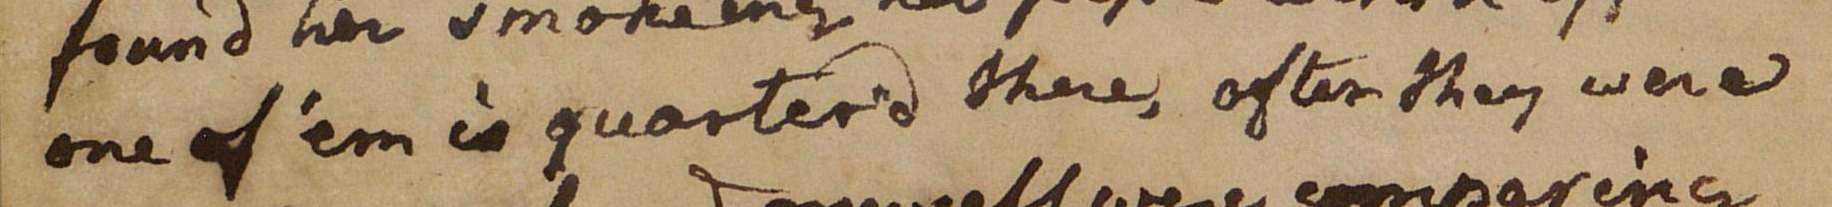one of 'em is quarter'd there, after they were
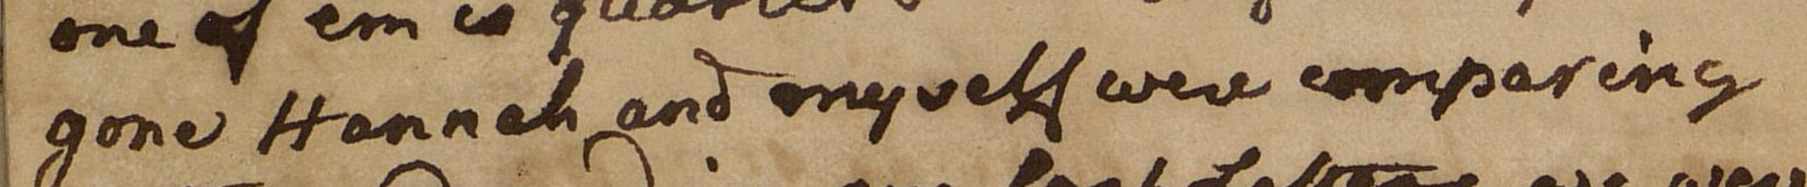gone Hannah and myself were comparing
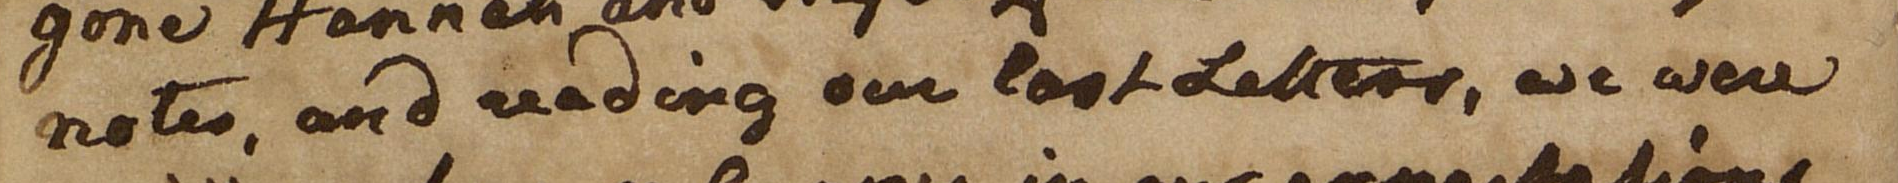notes, and reading our last Letters, we were
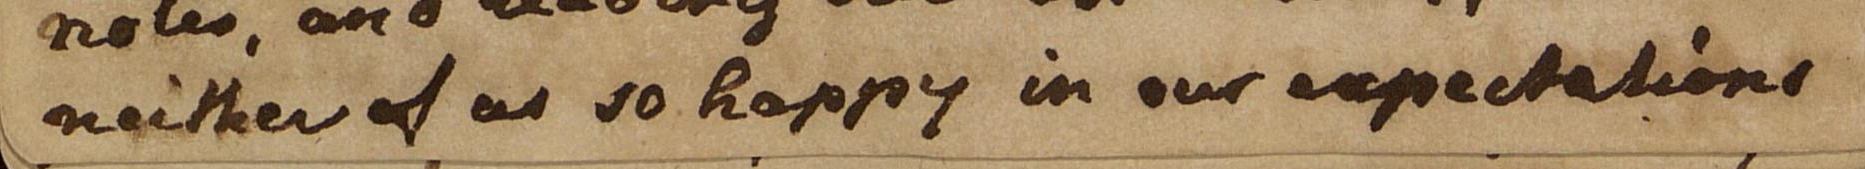neither of as so happy in our expectations
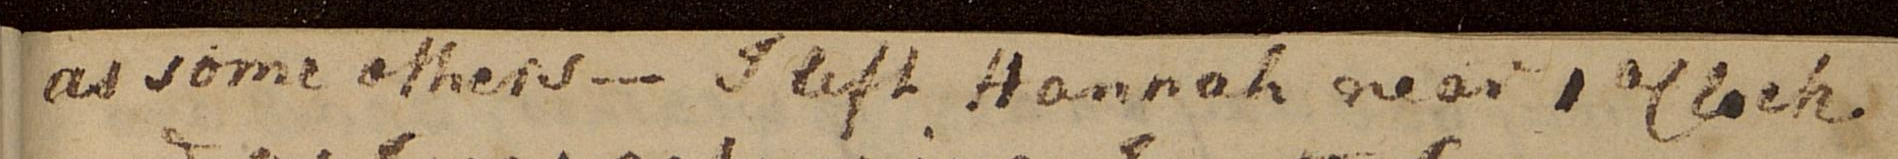as some others- I left Hannah near 1 oClock
